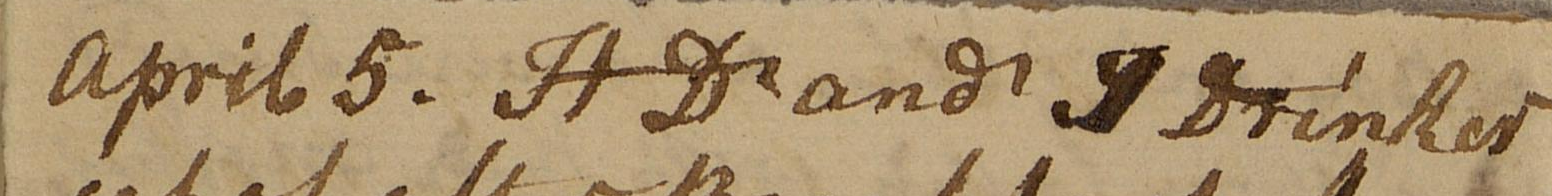April 5. HD and J Drinker
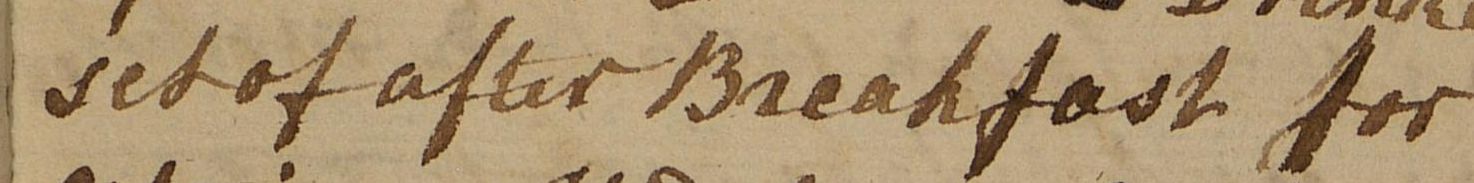set of after Breakfast for
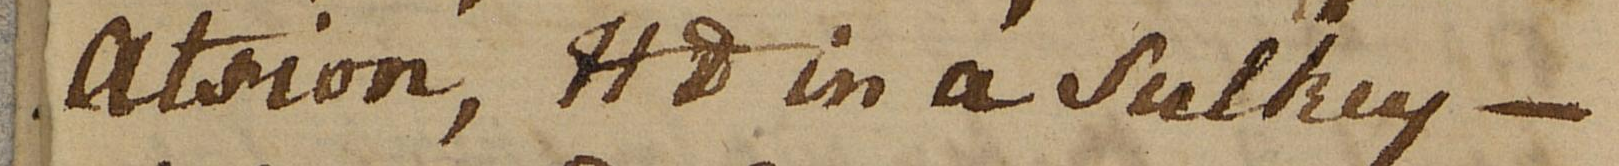Atsion, HD in a Sulkey-
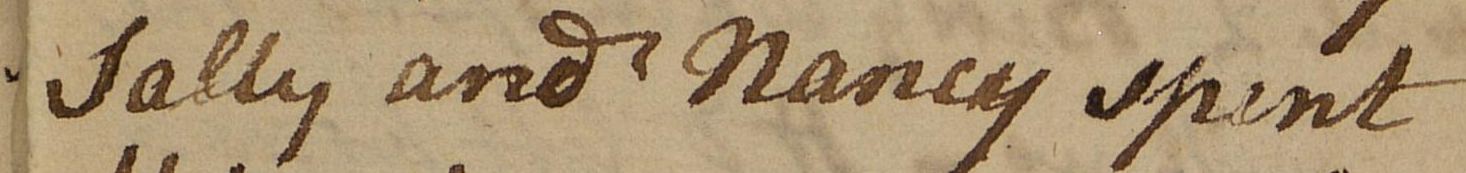Sally and Nancy spent
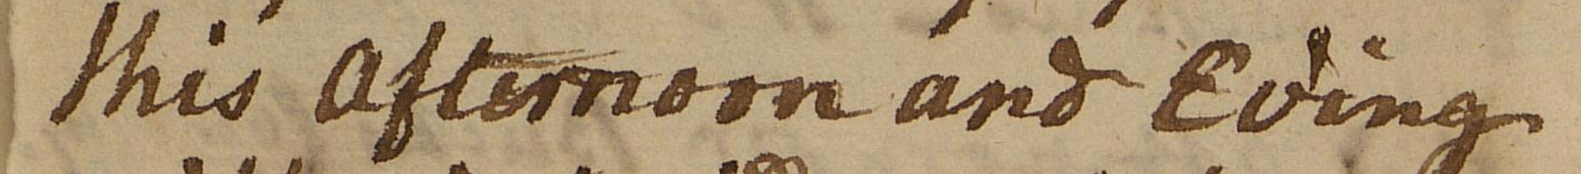this Afternoon and Eving
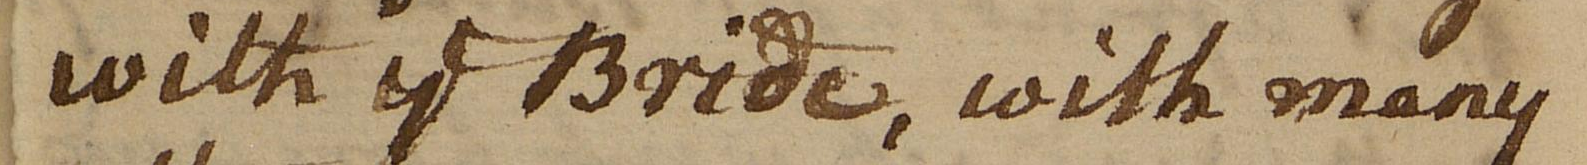with y^e Bride, with many
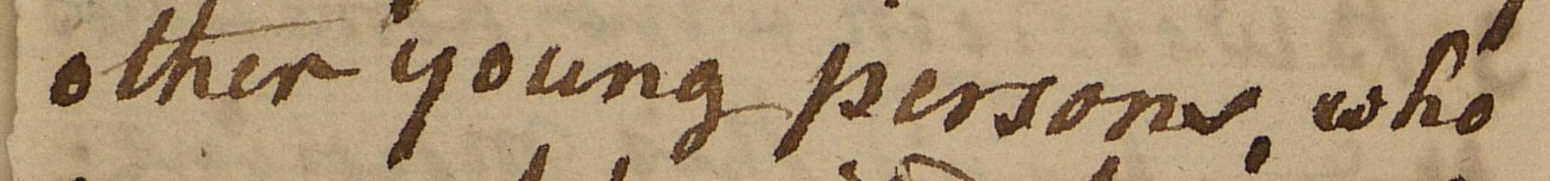other young persons, who
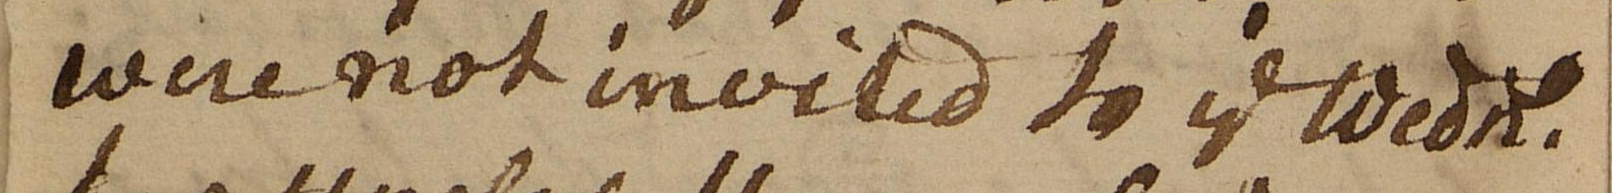were not invited to y^e Wedn^g.
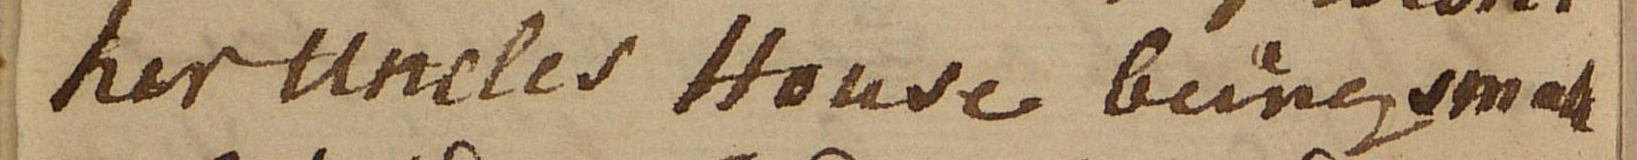her Uncles House being small
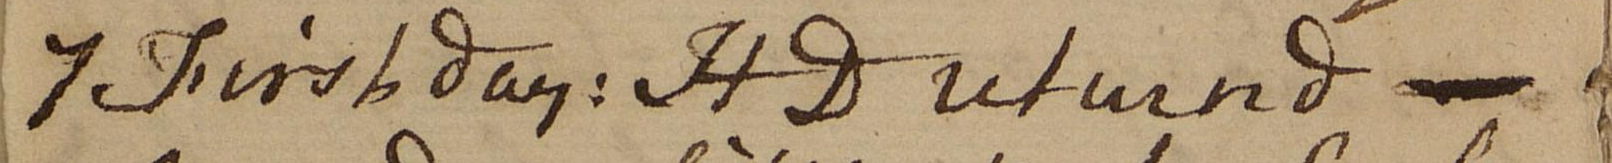7 First day: HD returnd-
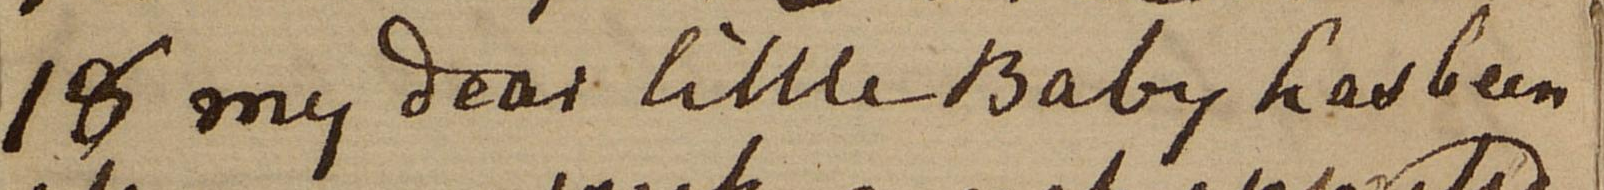18 my dear little Baby has been
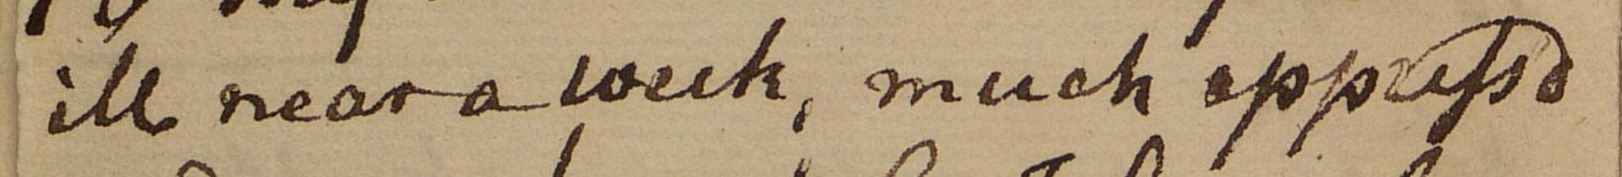ill near a week, much oppress'd
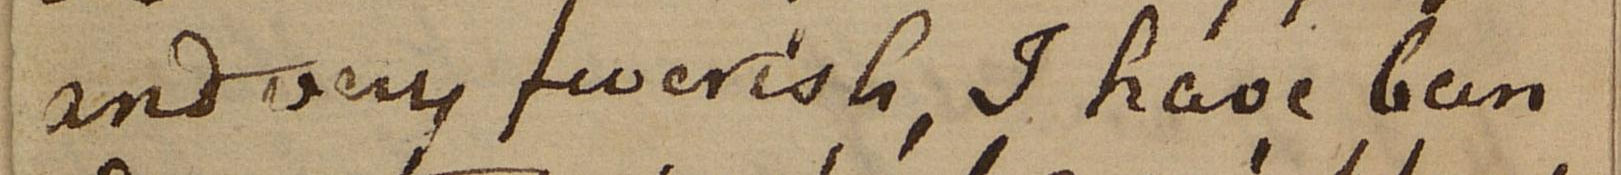and very feverish, I have been
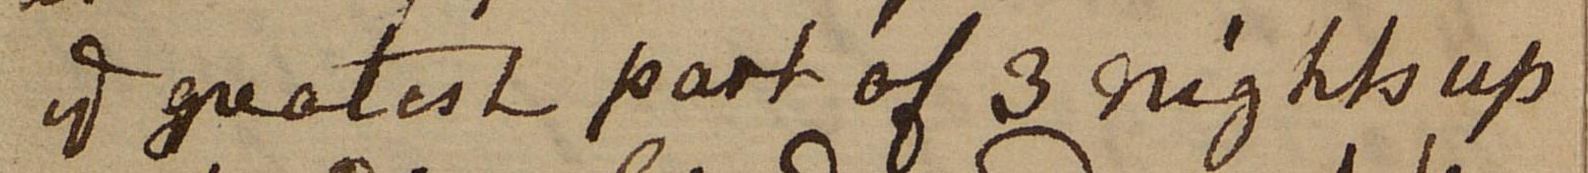y^e greatest part of 3 nights up
